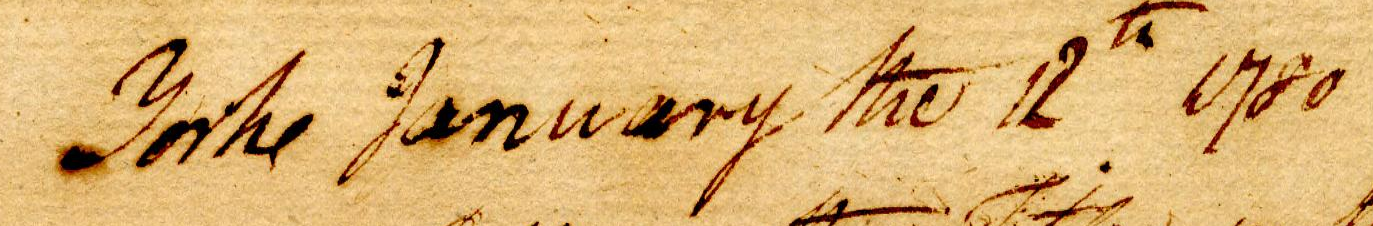Yorke January the 12^th 1780
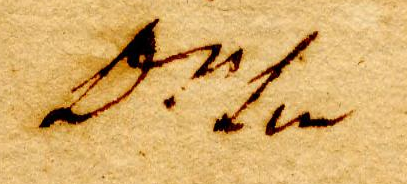D^r. Sir
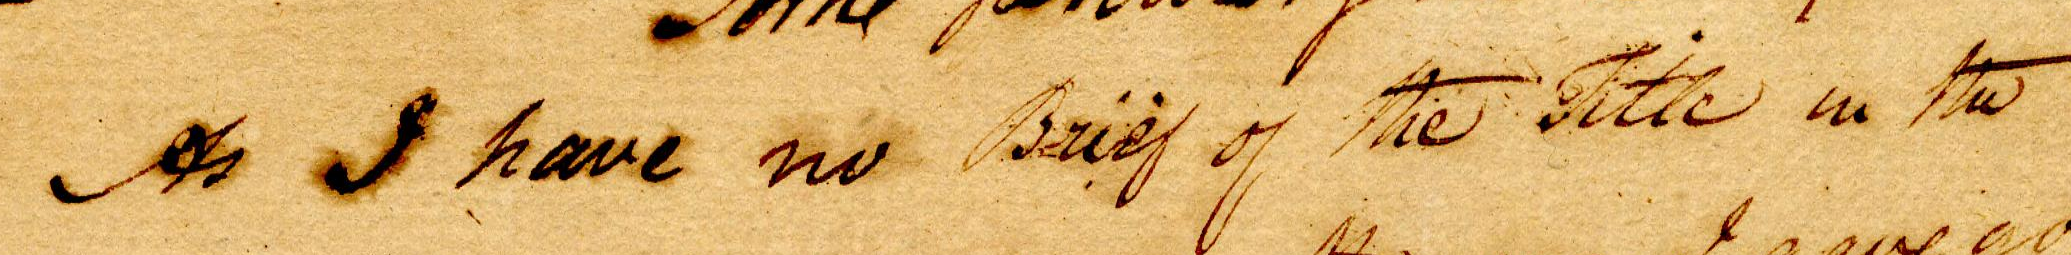As I have no Brief of the Title in the
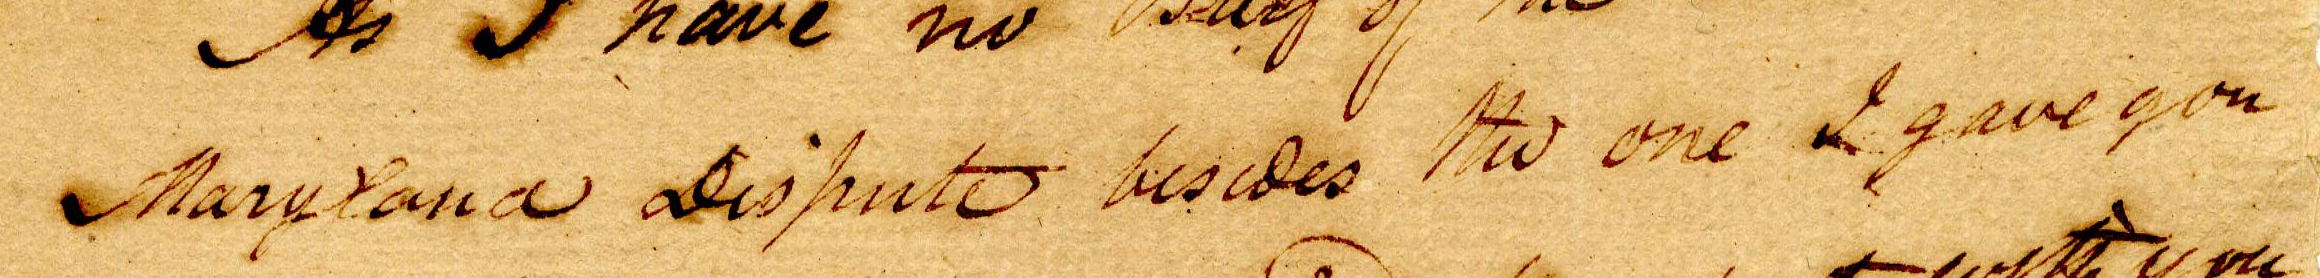Maryland Dispute besides the one I gave you
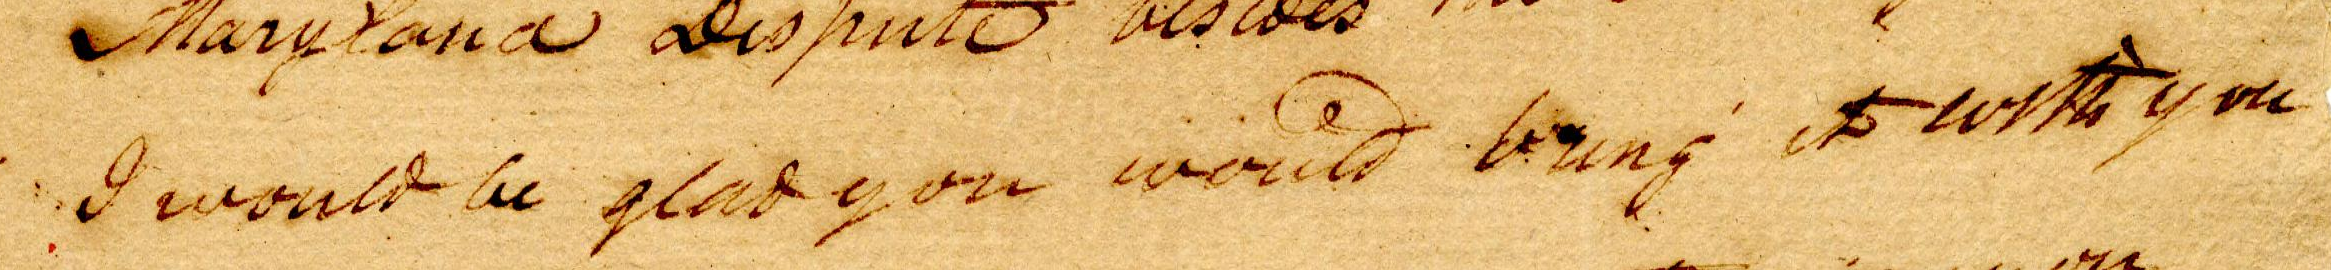I would be glad you would bring it with you
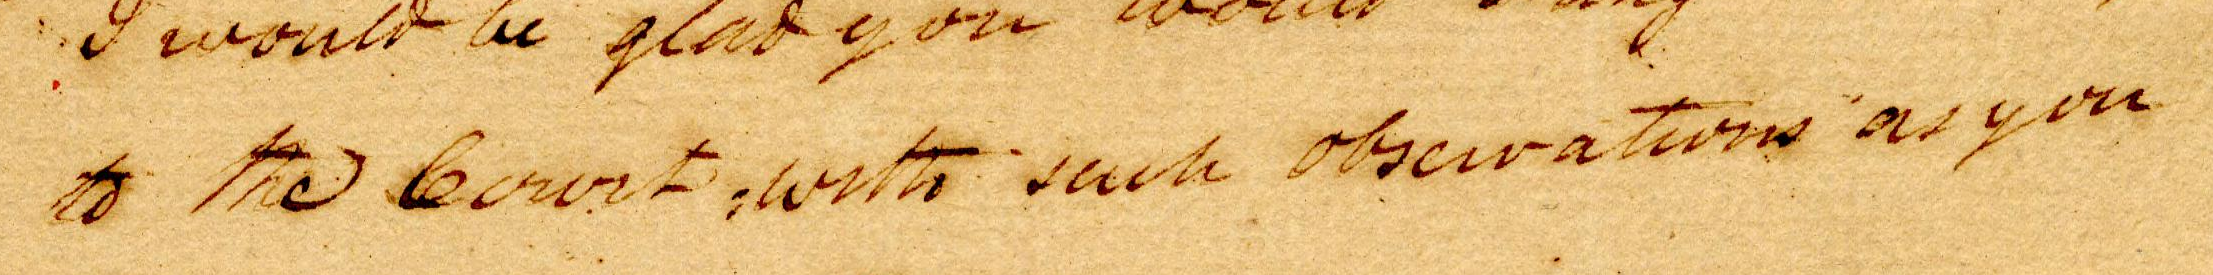to the Court, with such observations as you
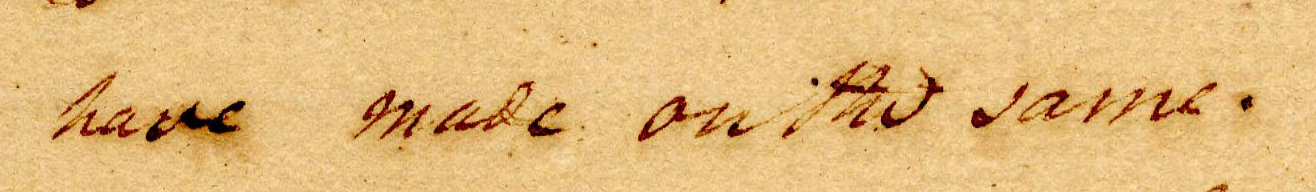have made on the same.
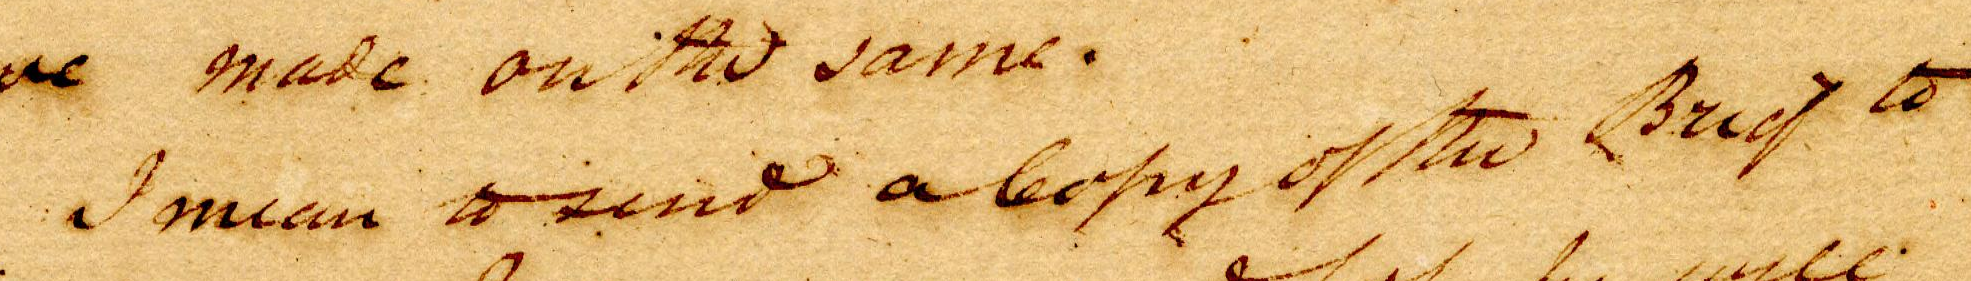I mean to send a Copy of the Brief to
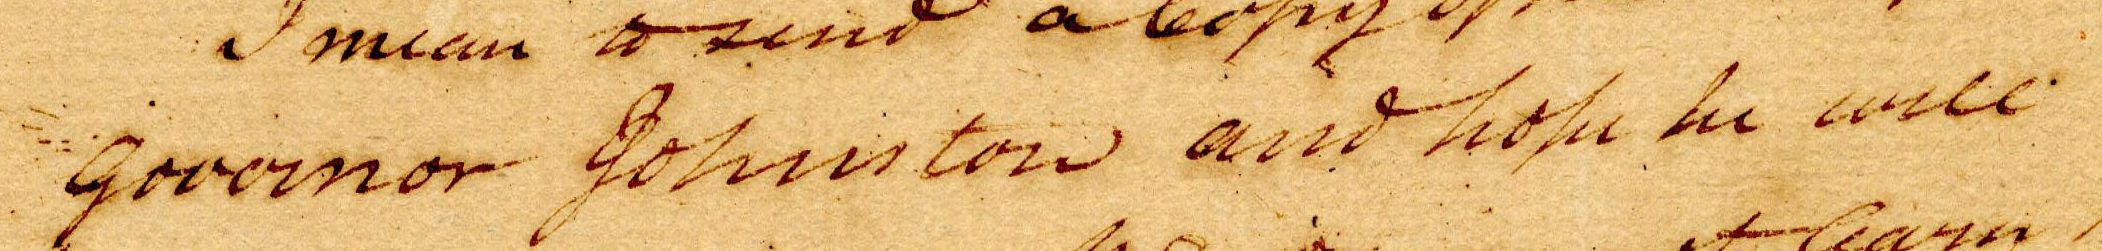Govenor Johnston and hope he will
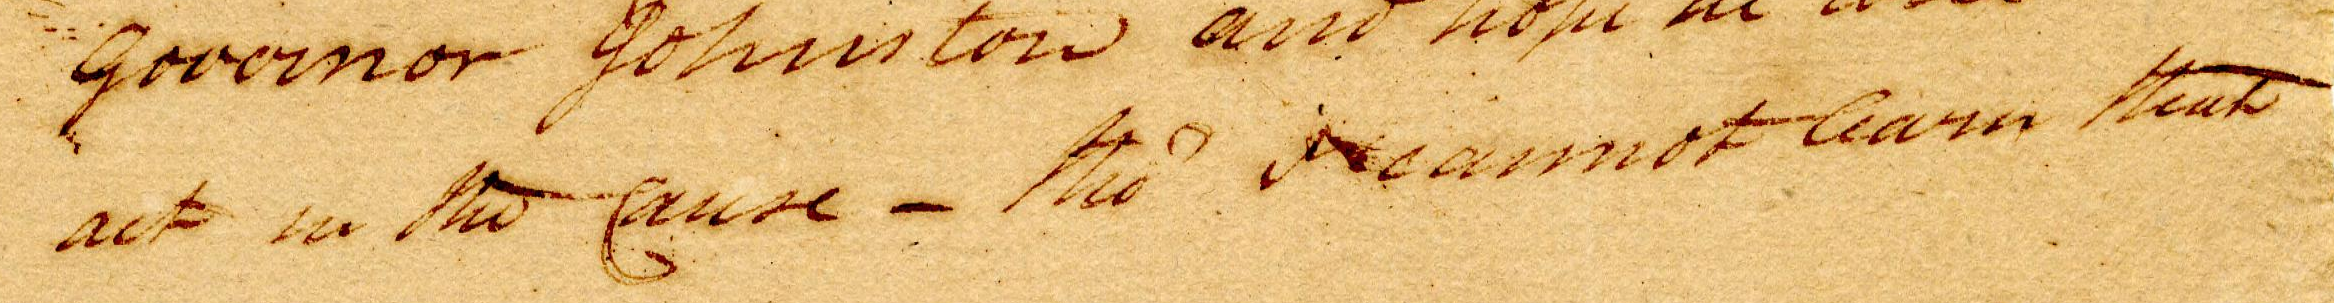act in the Cause. Tho' I cannot learn What
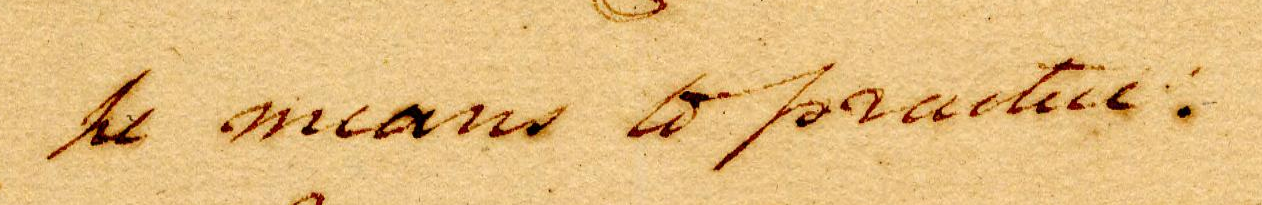he means to practice.
